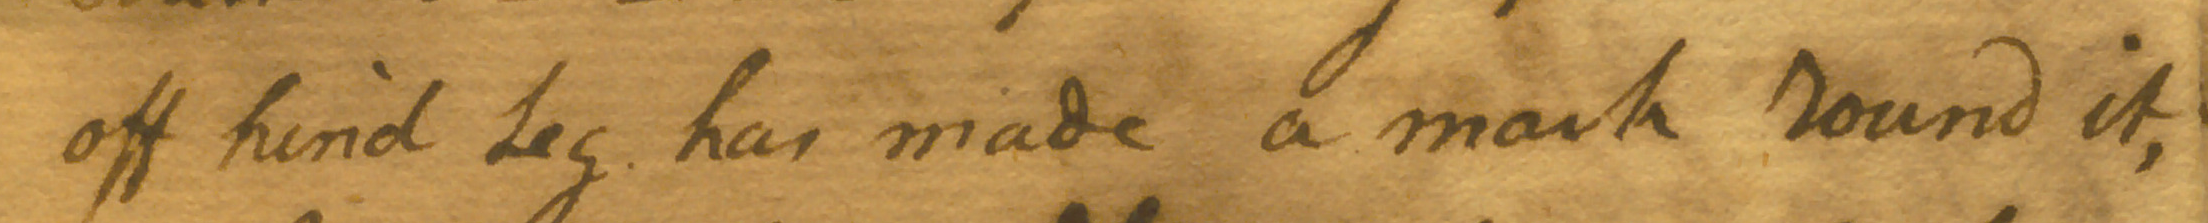off hind Leg. has made a mark round it,
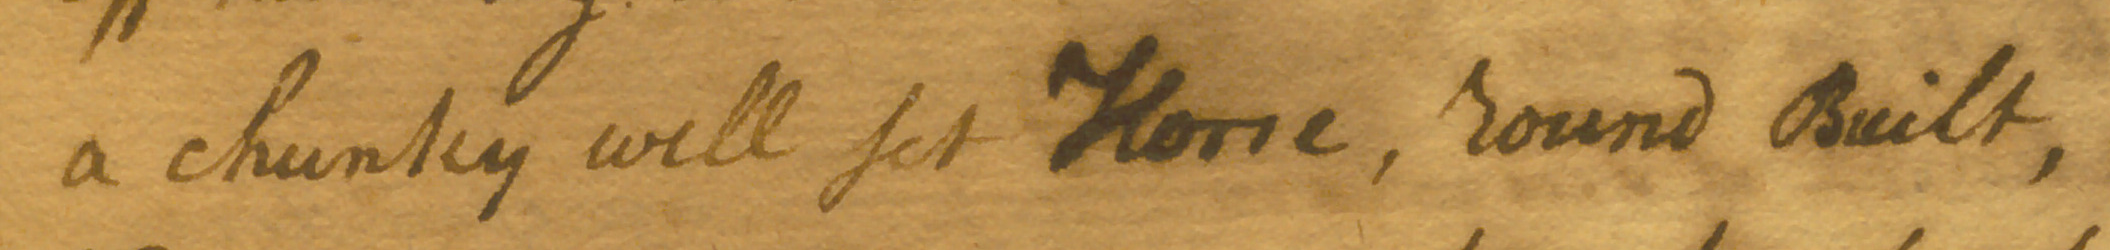a chunky well set Horse, round Built,
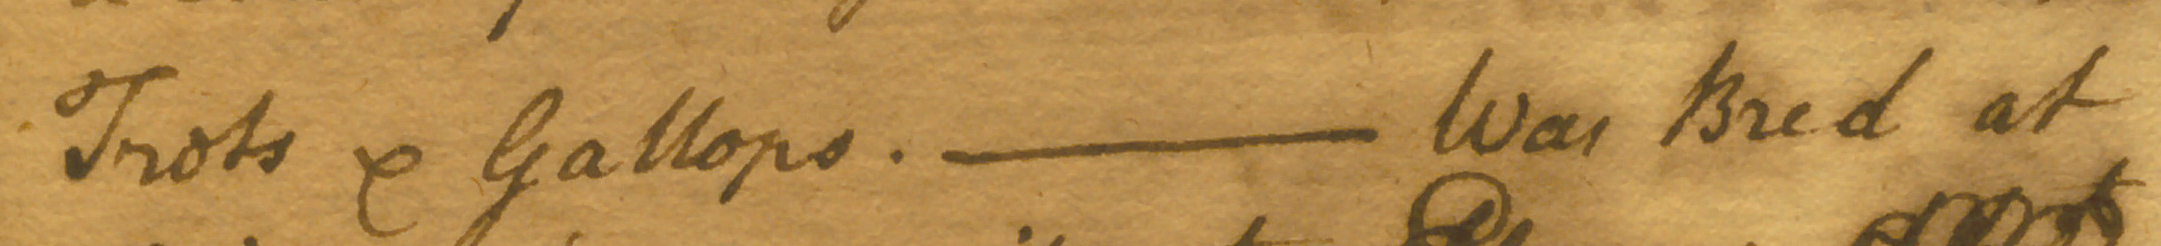Trots & Gallops.- Was Bred at
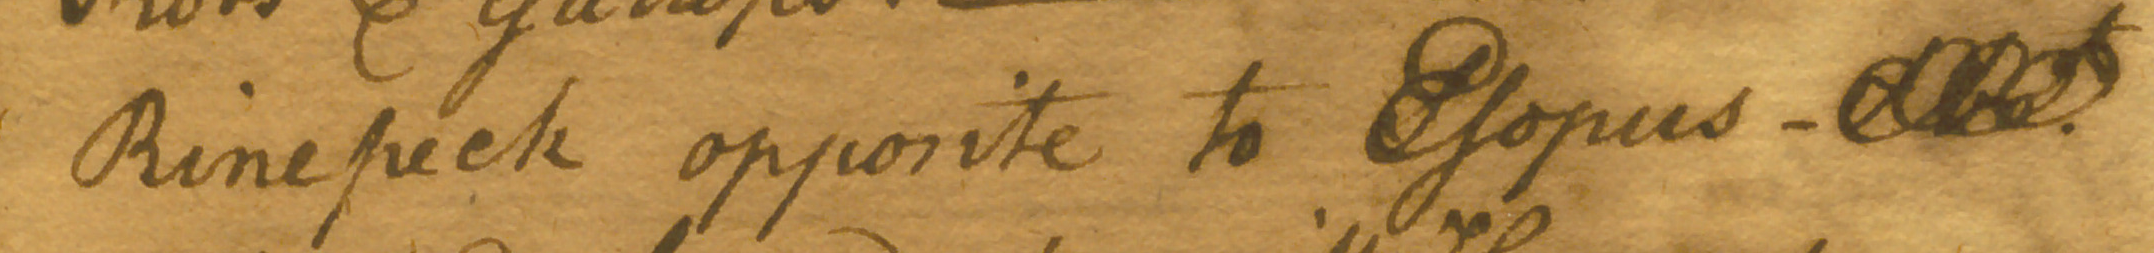Rinepeck opposite to Esopus. [____]
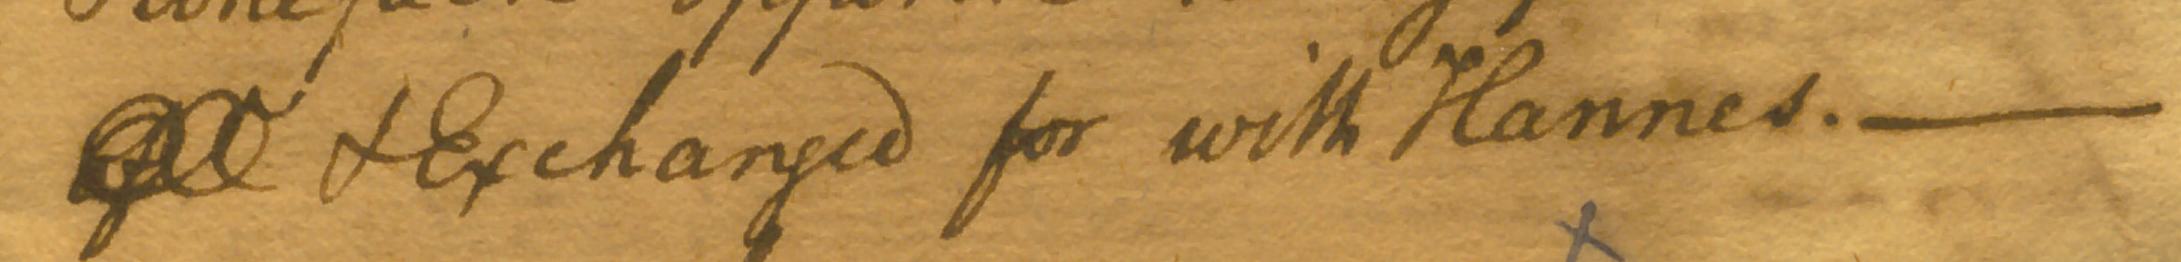& Exchanged for with Hannes.-
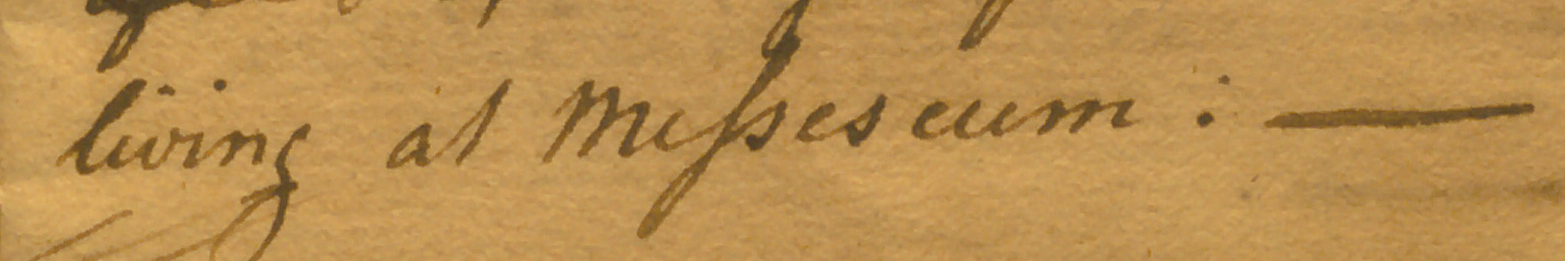living at Messescum:-
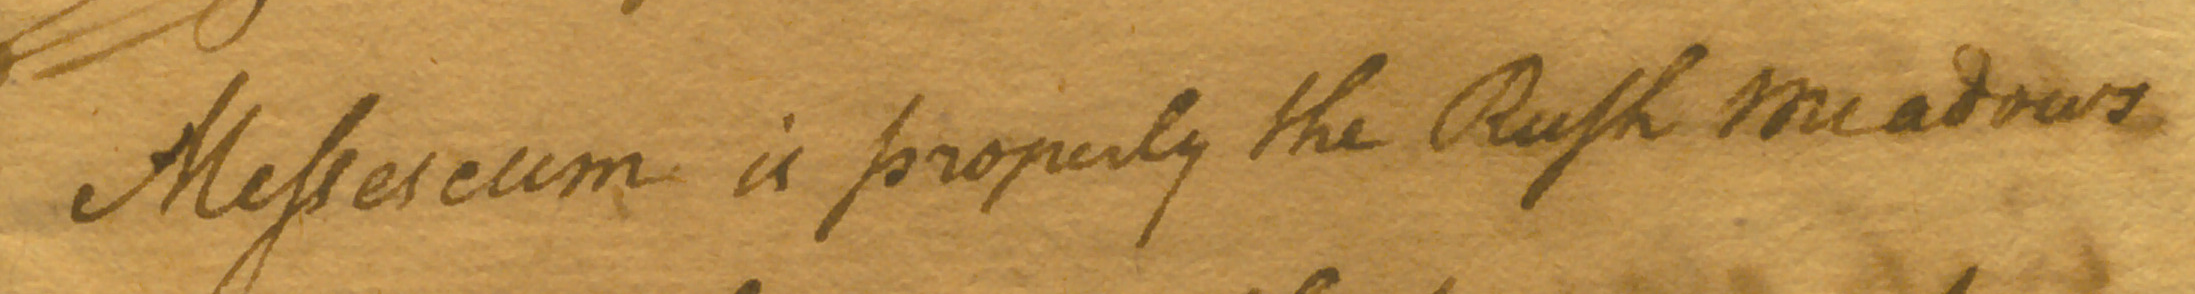Messescum is properly the Rush Meadows
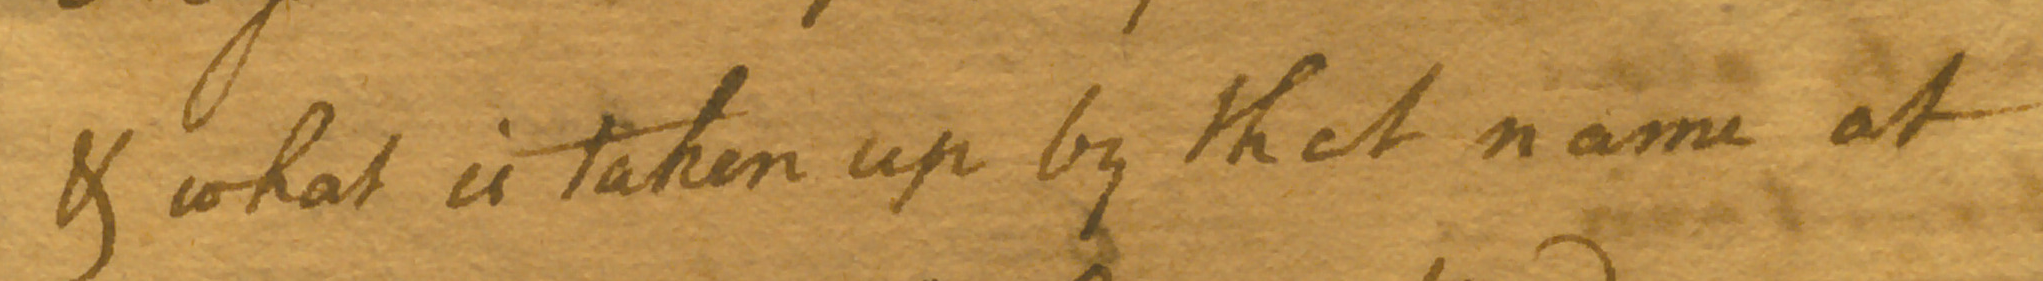& what is taken up by that name at
